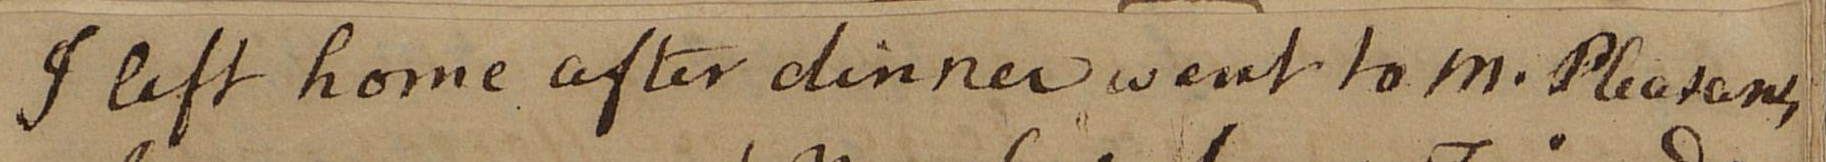I left home after dinner went to M. Pleasant
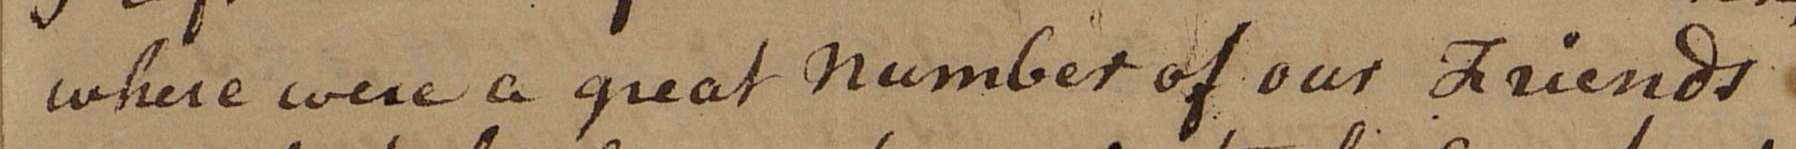where were a great number of our Friends
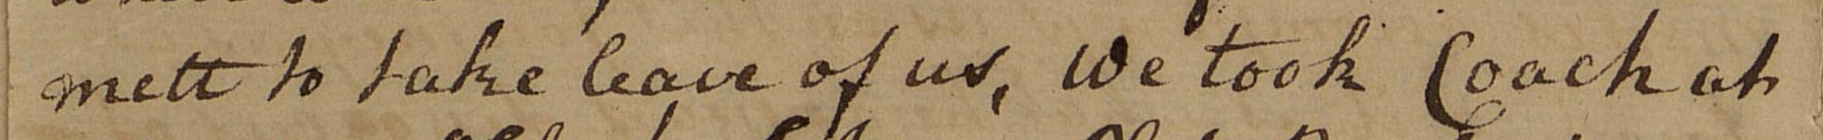mett to take leave of us, We took Coach at
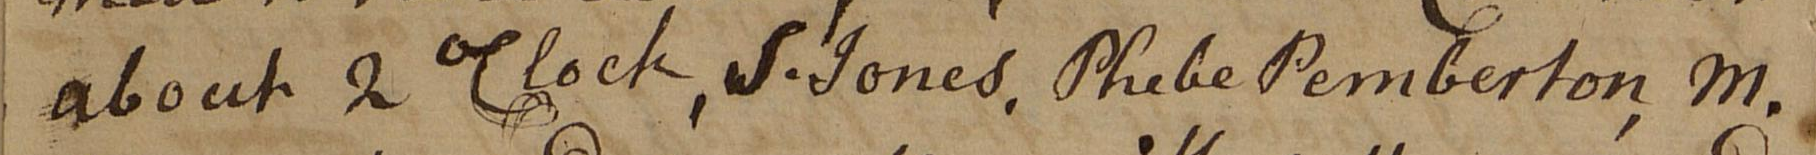about 2 ^oClock, S. Jones, Phebe Pemberton M.
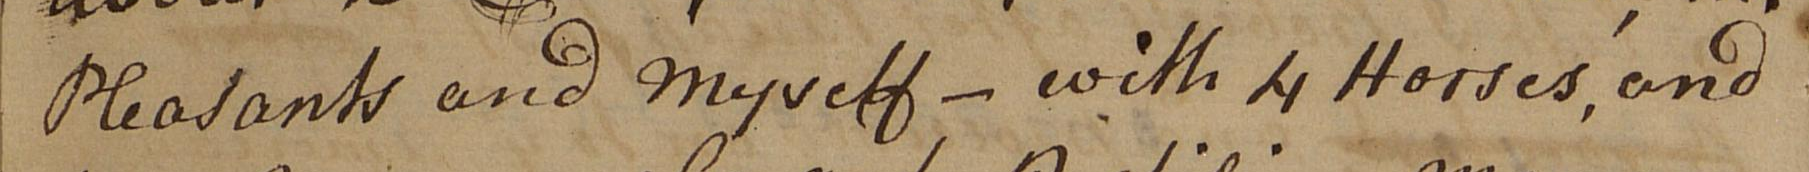Pleasants and myself- with 4 Horses, and
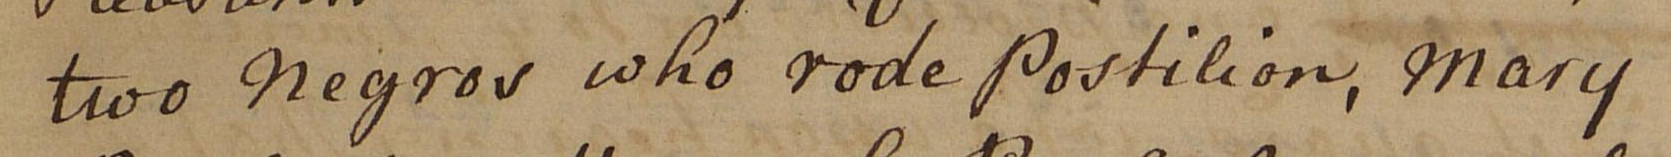two Negros who rode Postilion, Mary
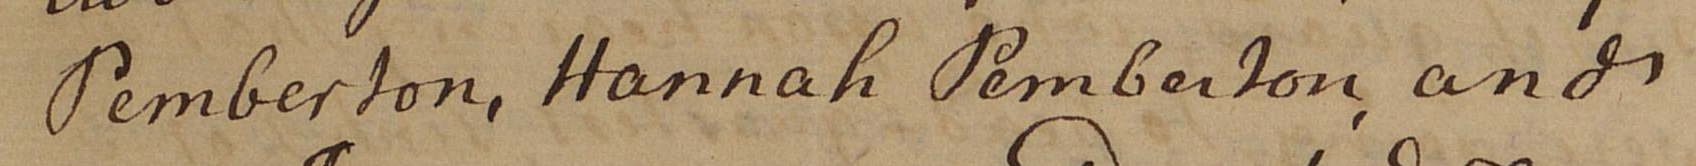Pemberton, Hannah Pemberton, and
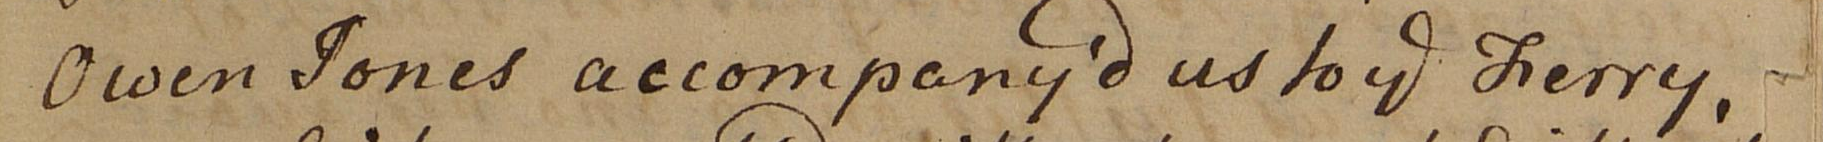Owen Jones accompany'd us to y^e Ferry,
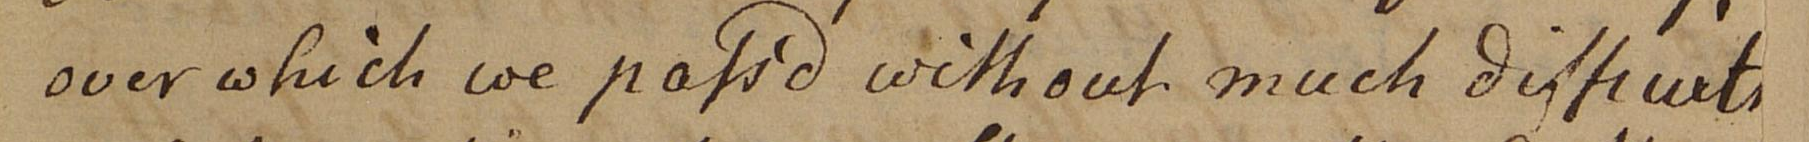over which we pass'd without much diffcuit
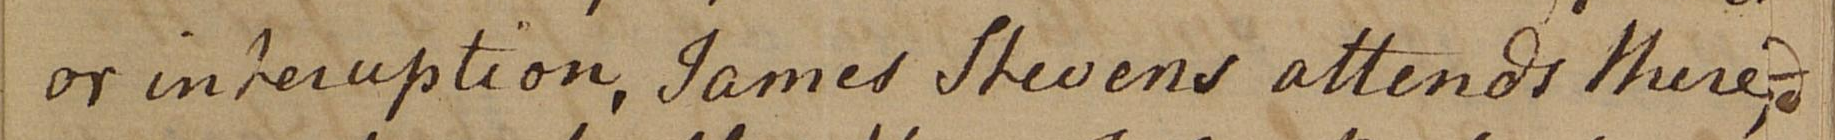or interuption, James Stevens attends there
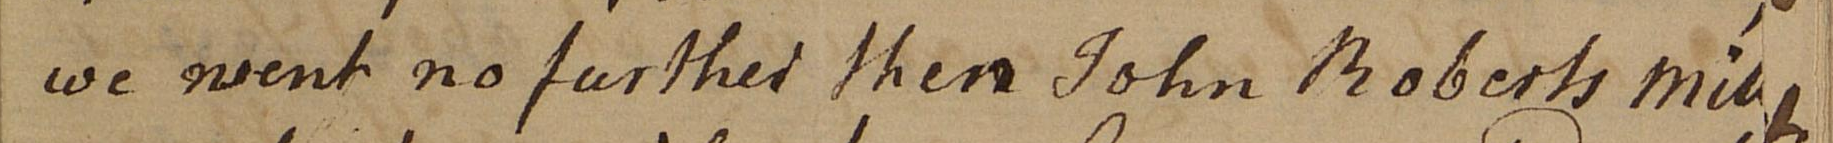we went no further then John Roberts mil
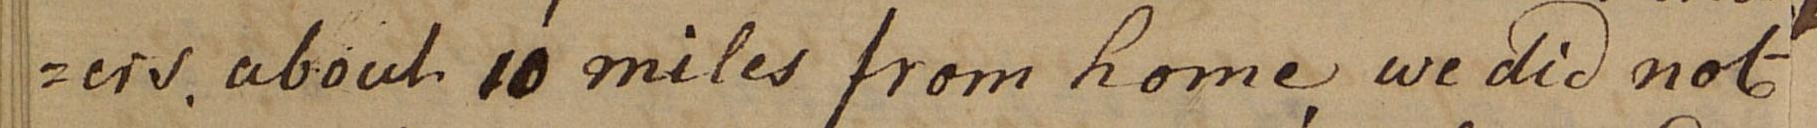-ers about 10 miles from home, we did not
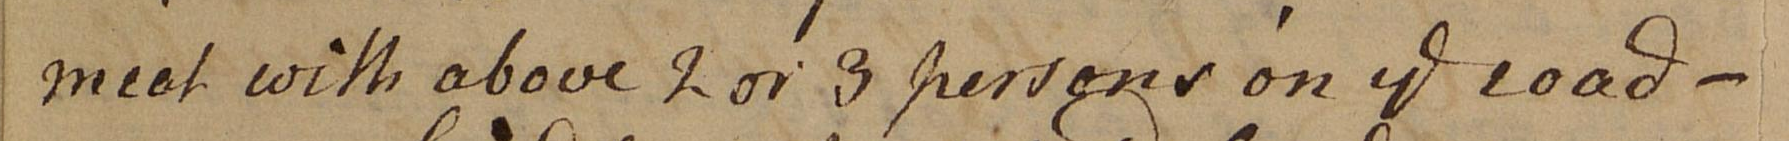meat with above 2 or 3 persons on y^e road-
